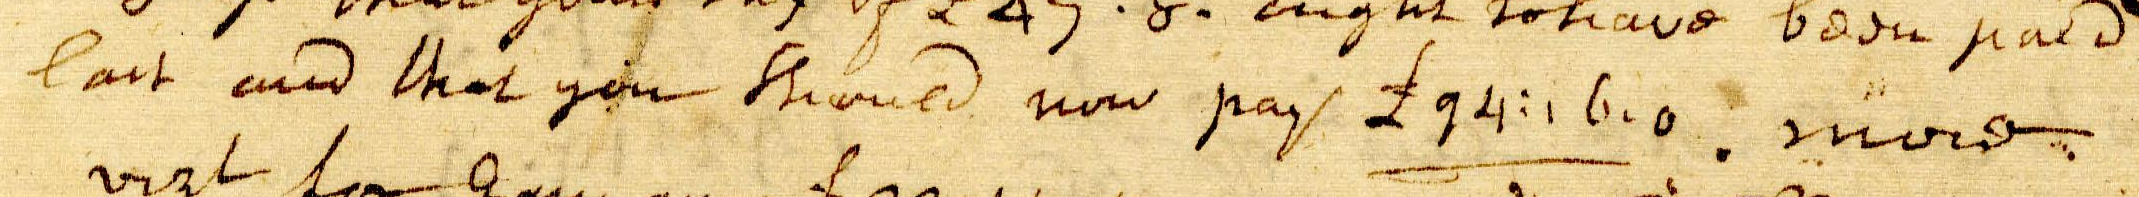last and that you Should now pay £94:16.0, more
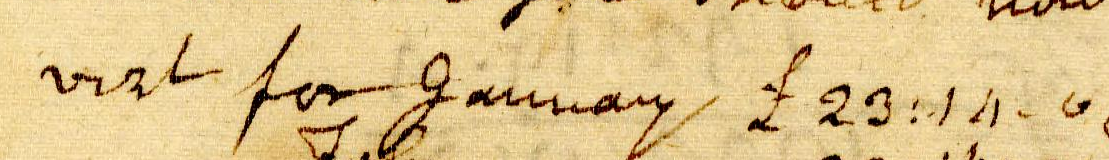vizt for January £23:14-0
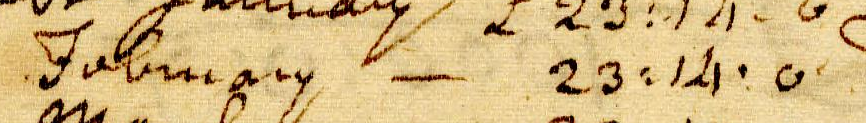February- 23.14. 0
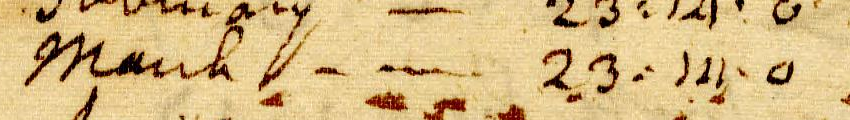March-- 23:14.0
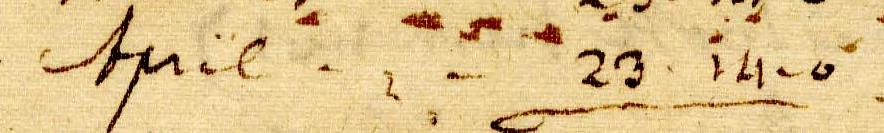April- 23.14.0
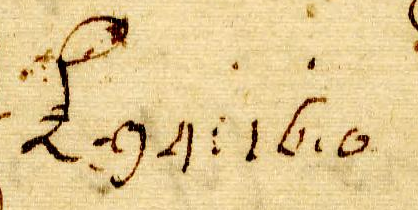£94:16.0
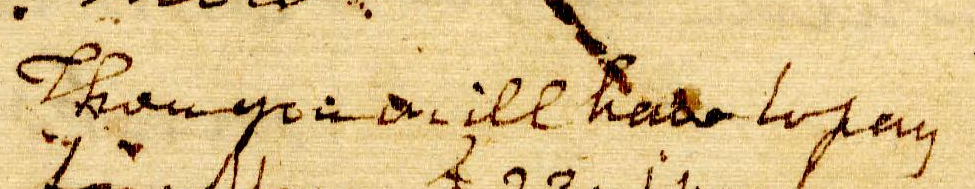Thou you ar ill have to pary
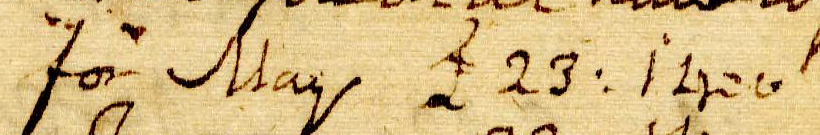for May £23. 1120
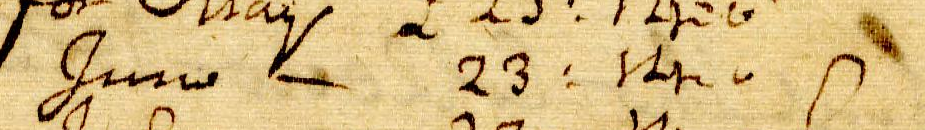June 23. 1
